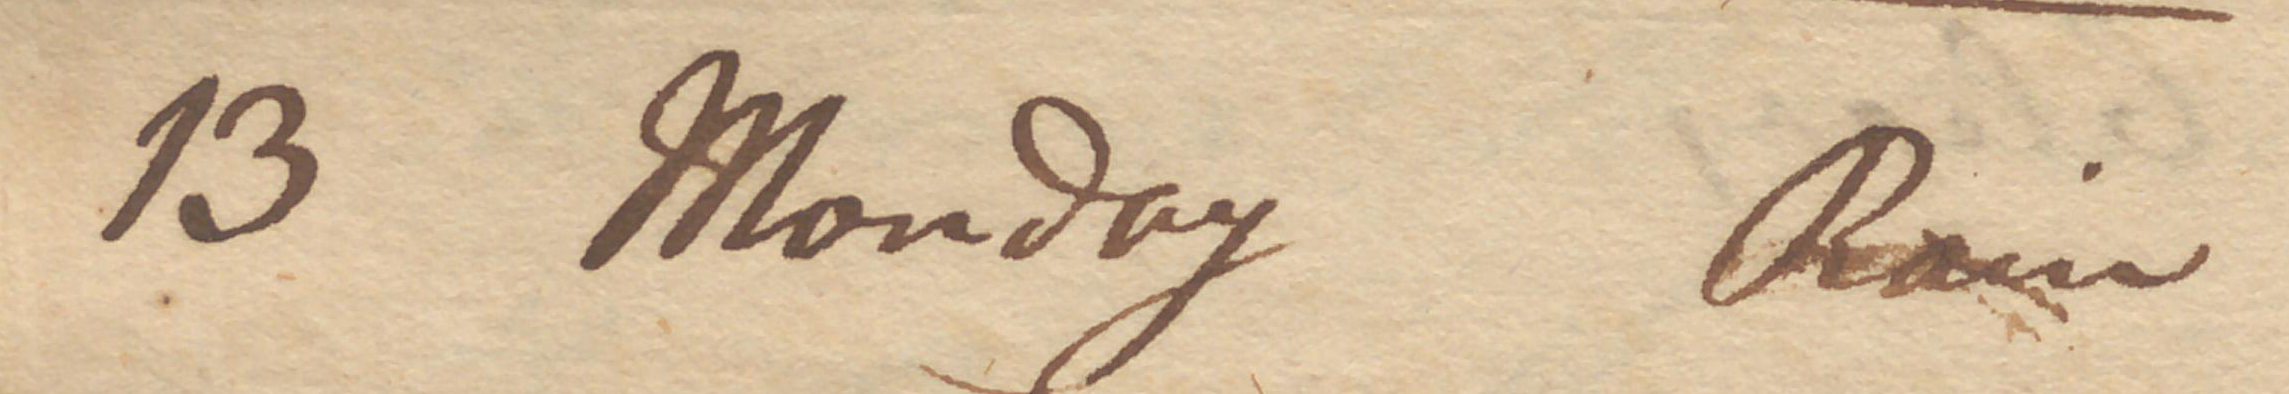13 Monday Rain
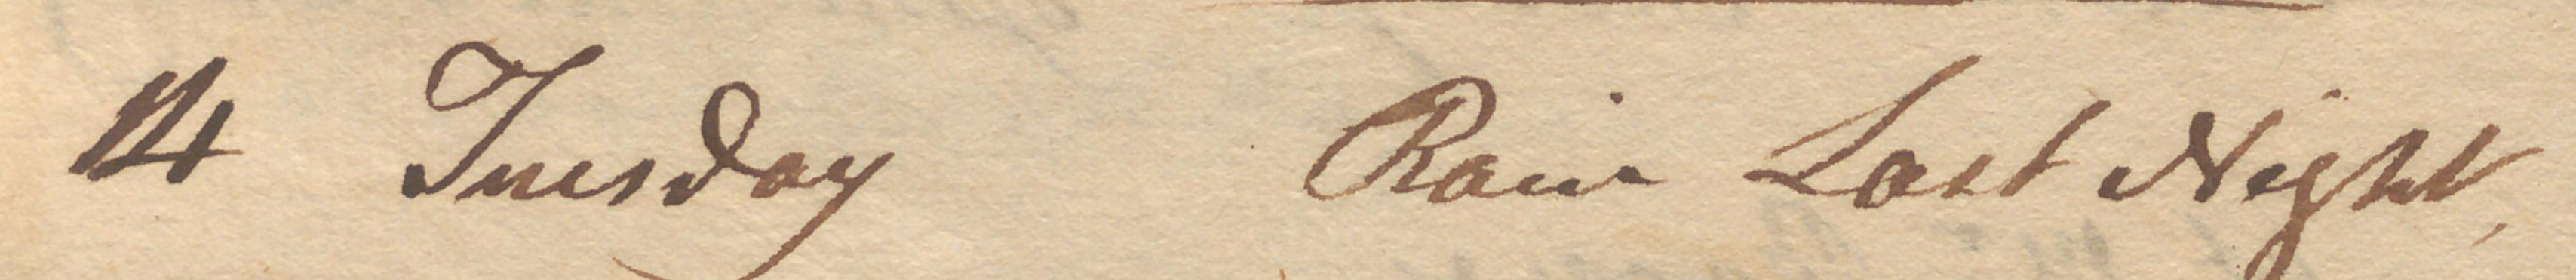14 Tuesday Rain Last Night
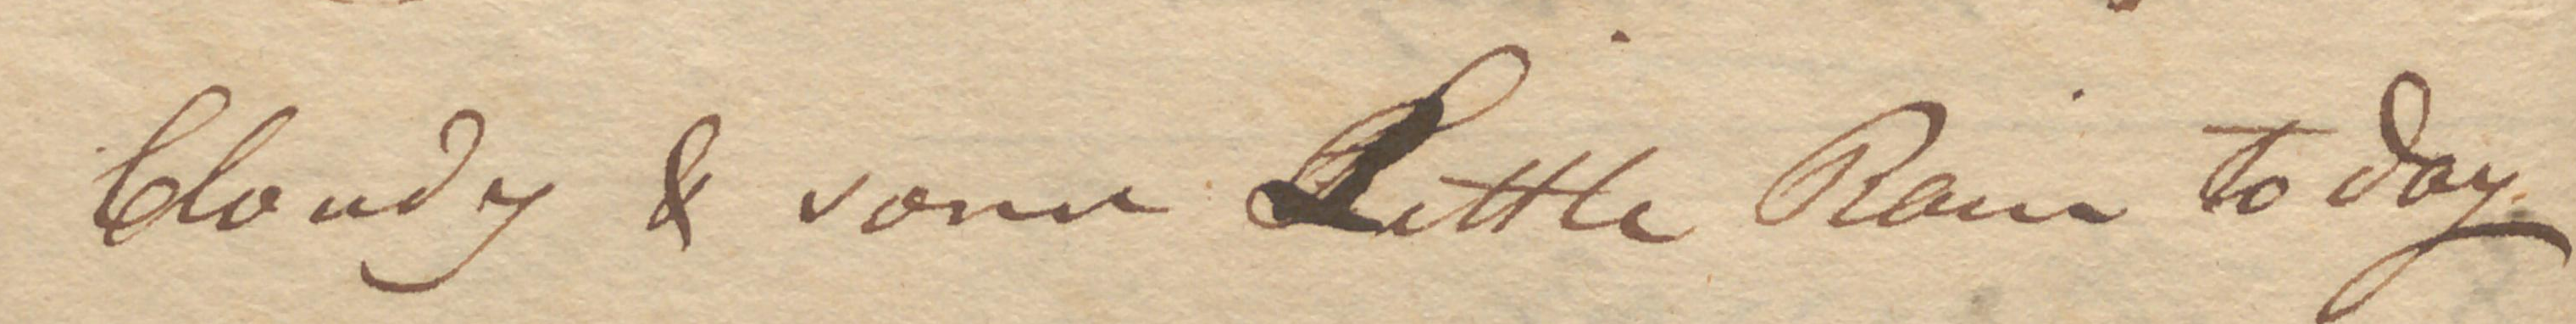Cloudy & some Little Rain to day
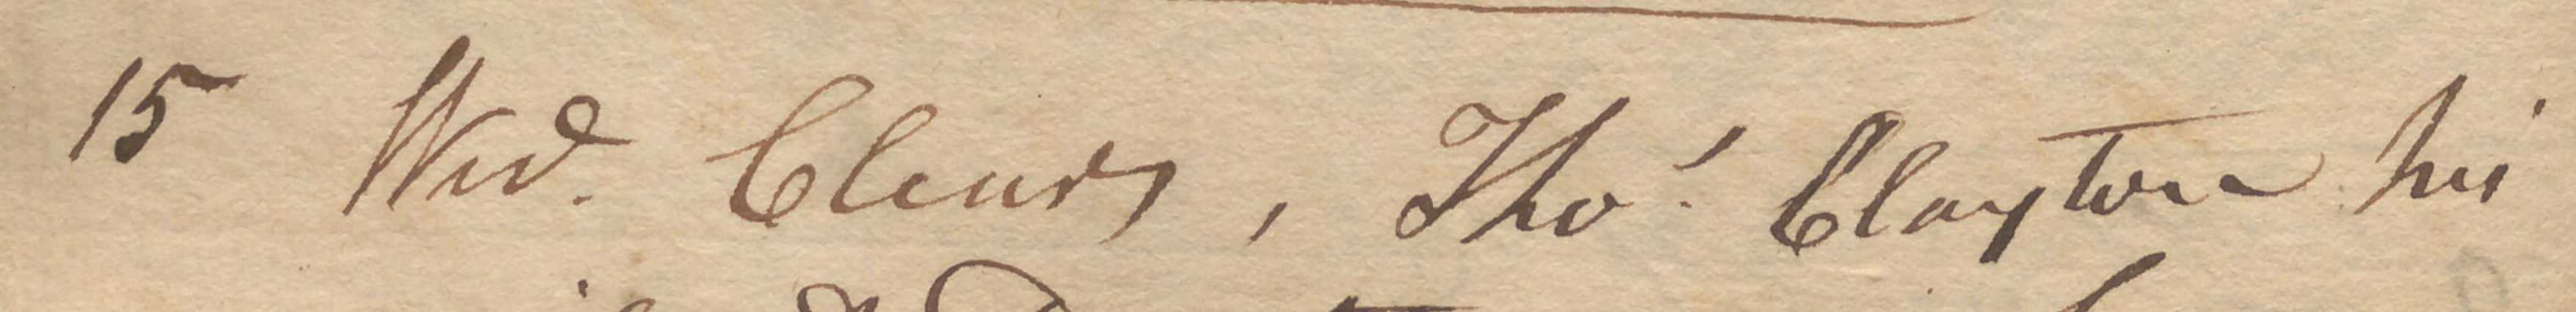15 Wed. Clear, Tho^s. Clayton his
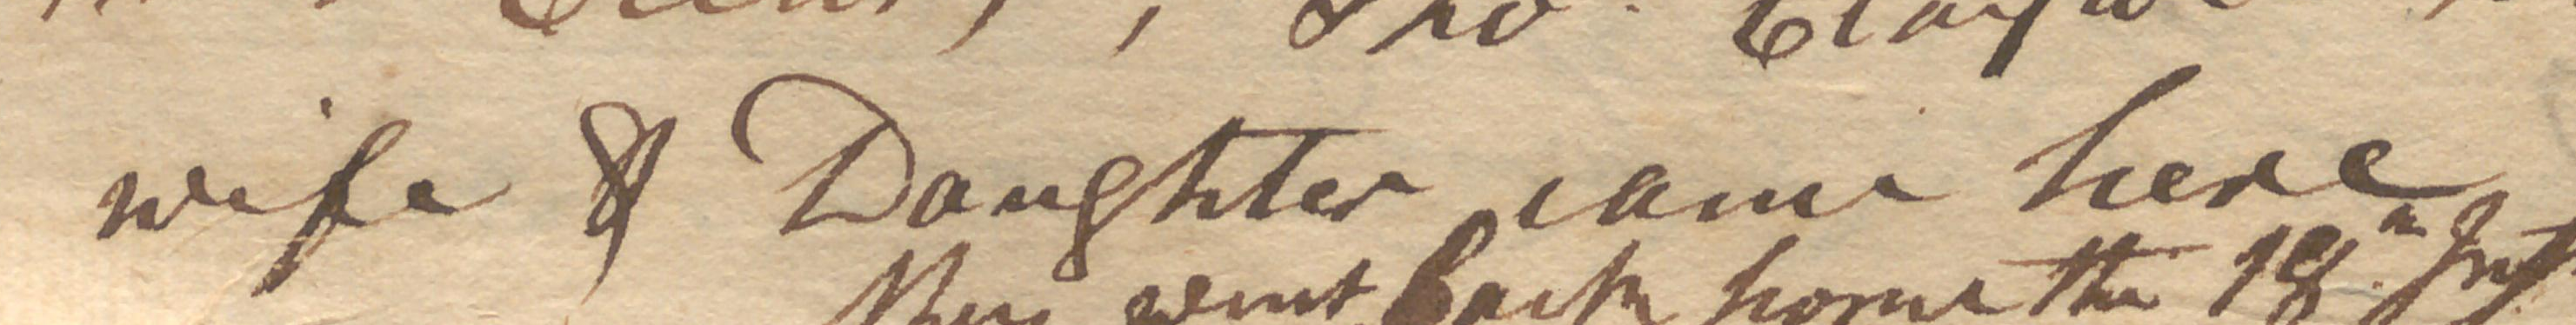wife & Daughter came here
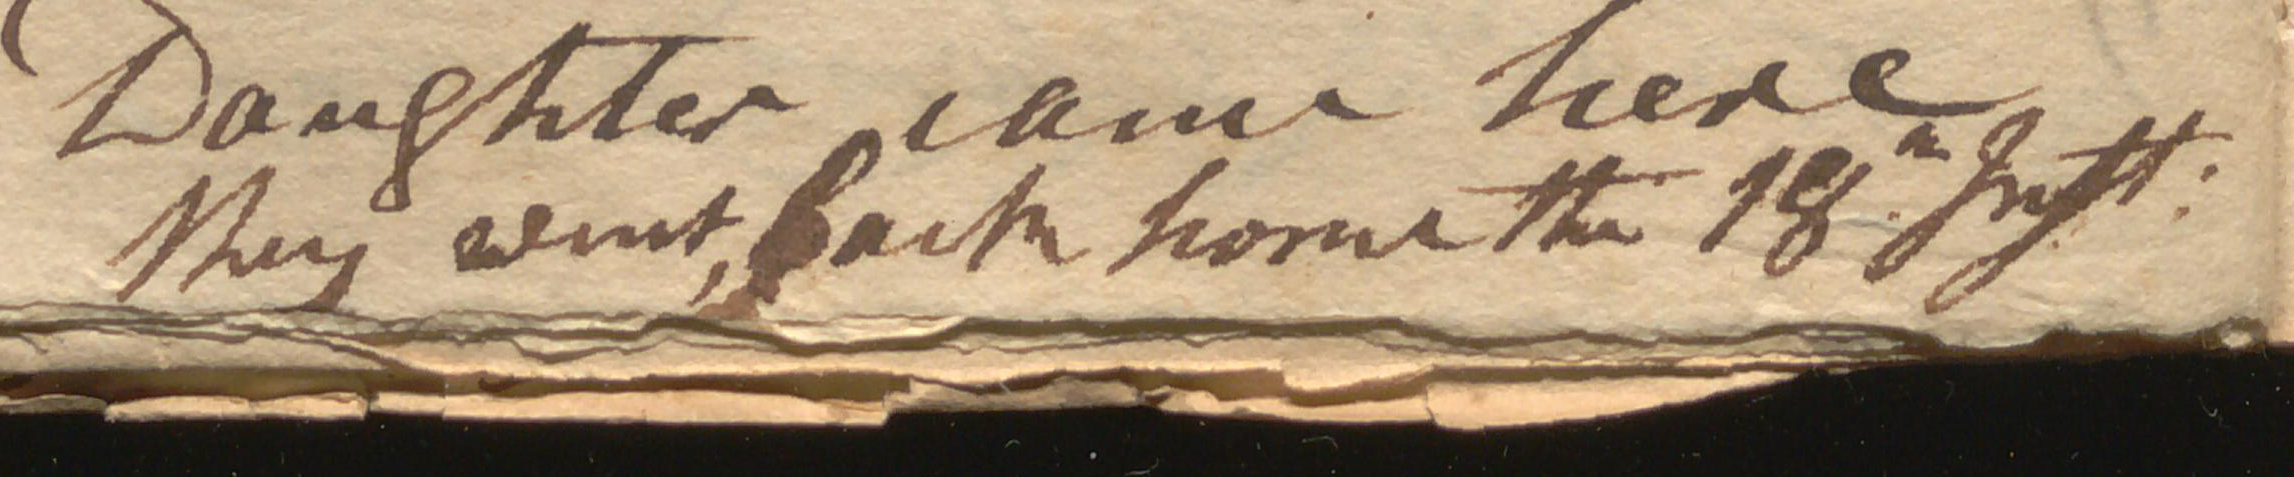they went back home the 18^th Ins^t:
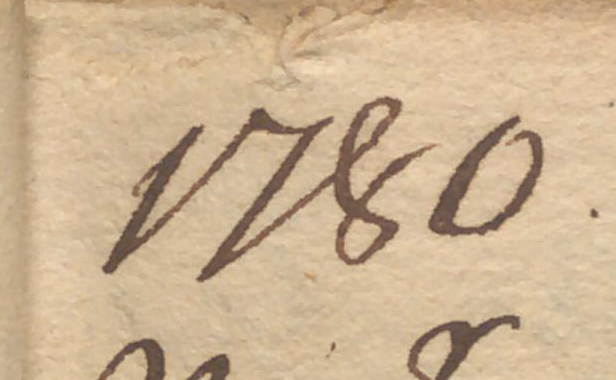1780
